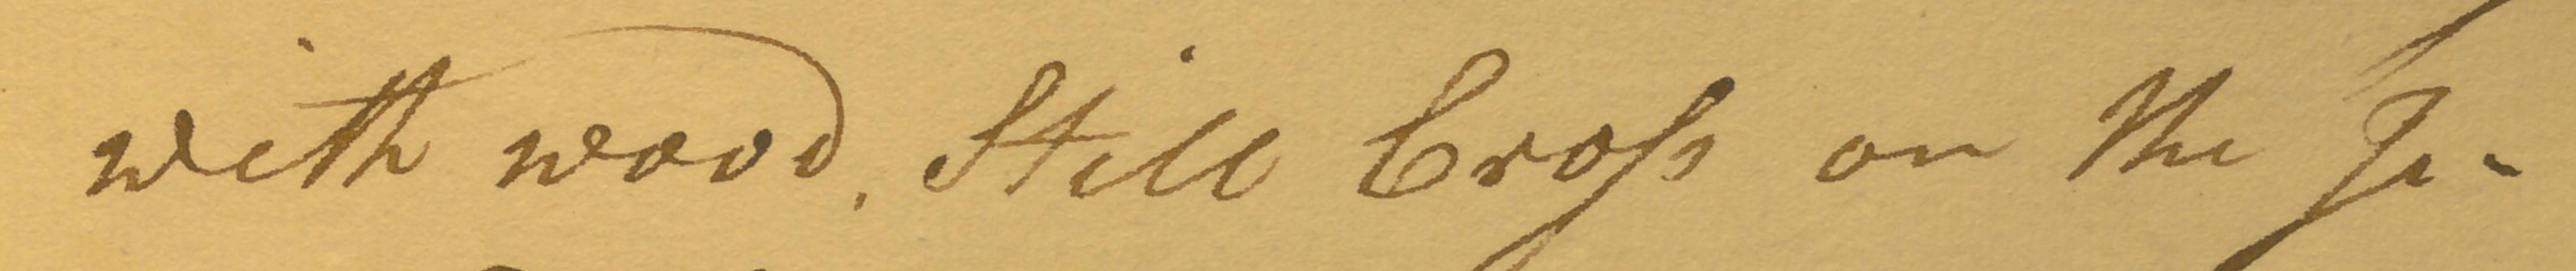with wood Still Cross on the Ice
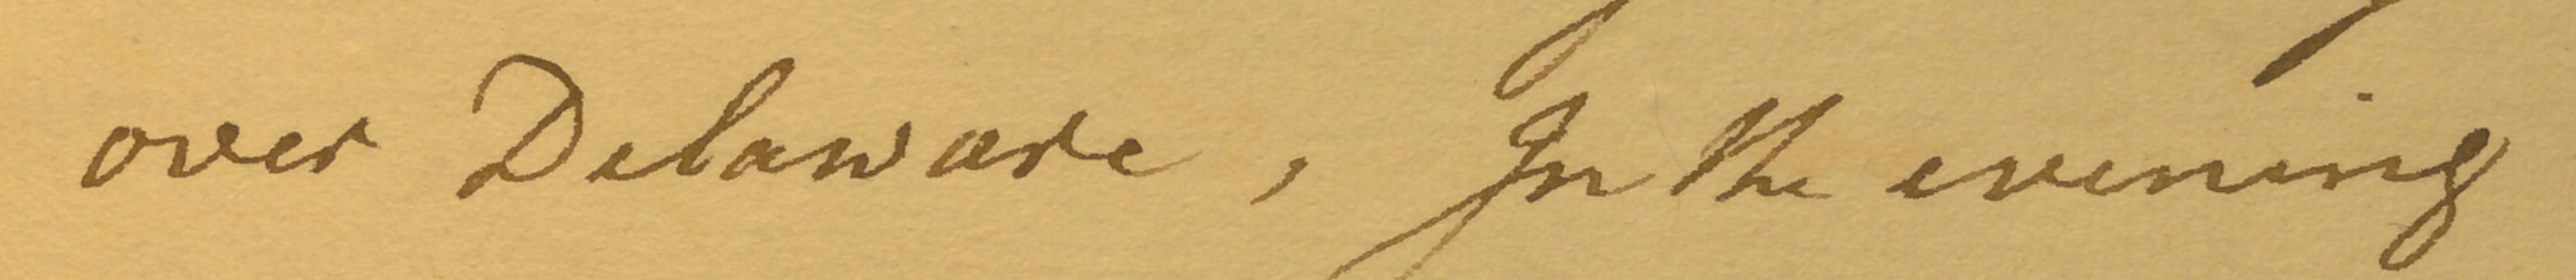over Delaware, In the evening
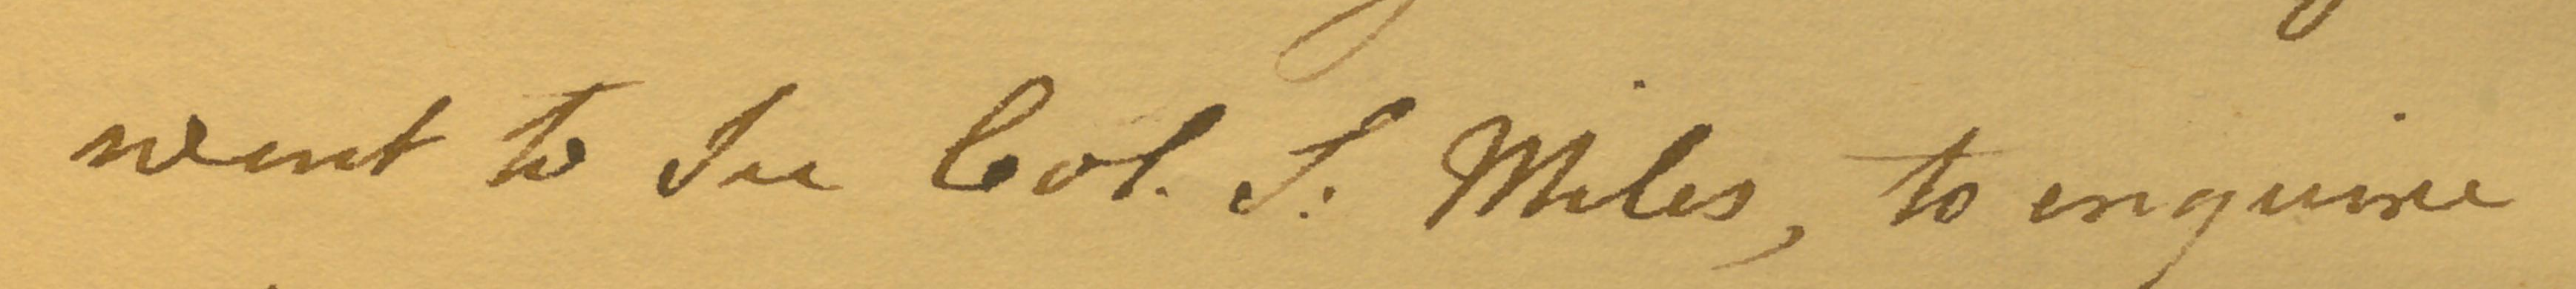went to see Col. S: Miles to enquire
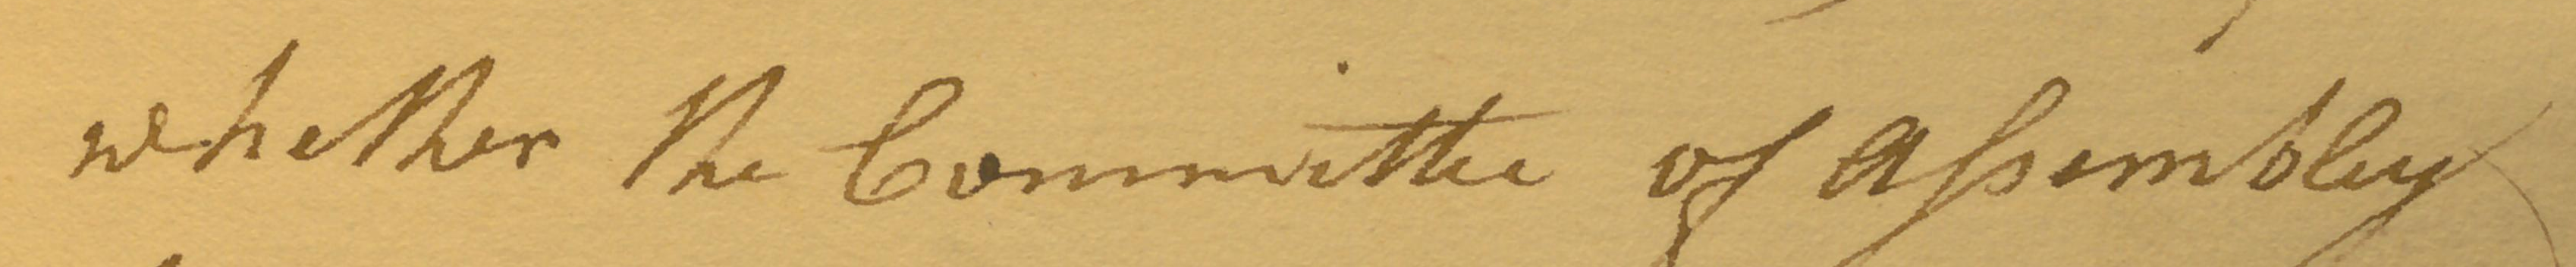whether the Committee of Assembley
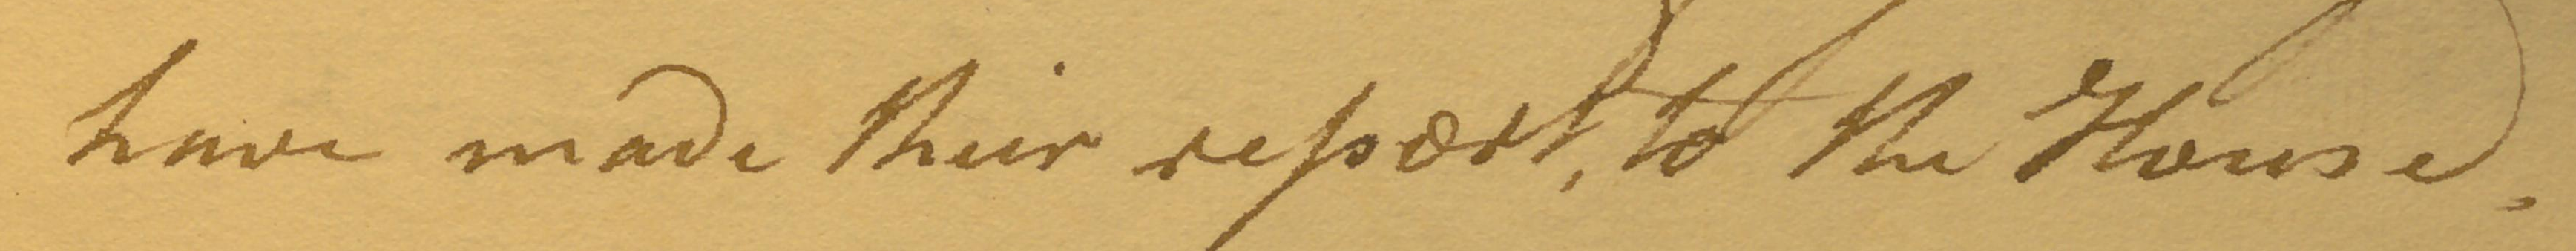have made their report to the House
